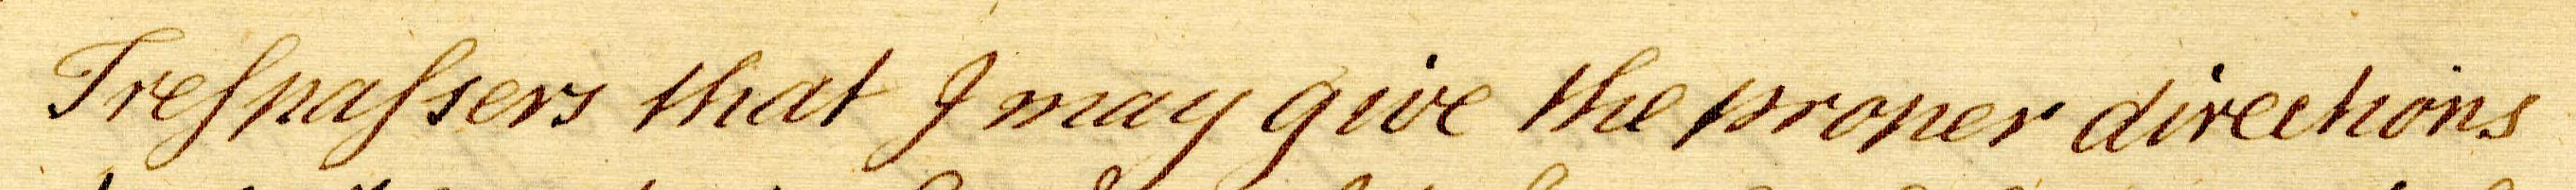Trespassers that I may give the proper directions
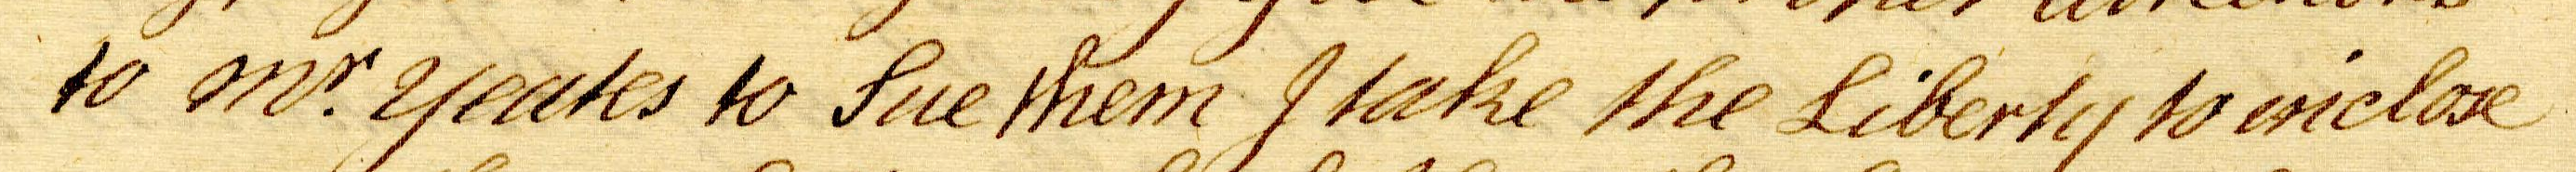to M^r. Yeates to Sue them I take the Liberty to inclose
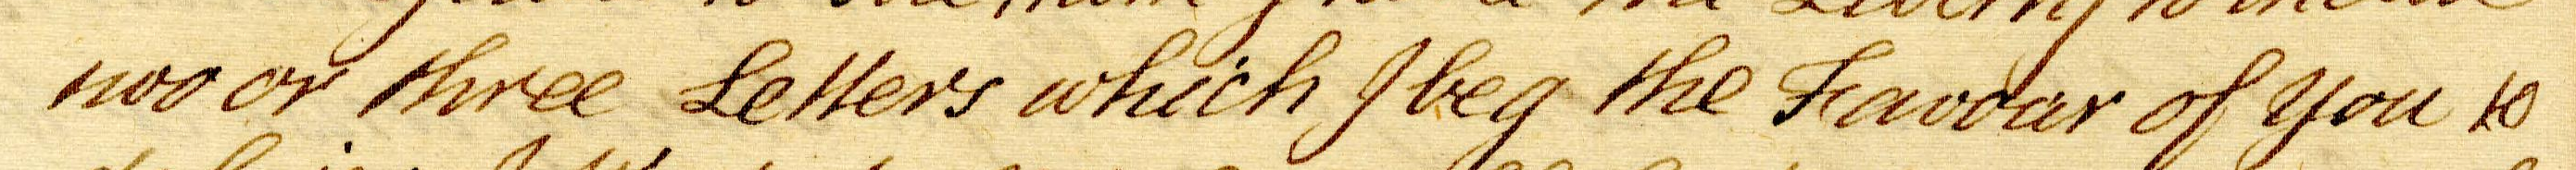two or three Letters which I beg the Favour of You to
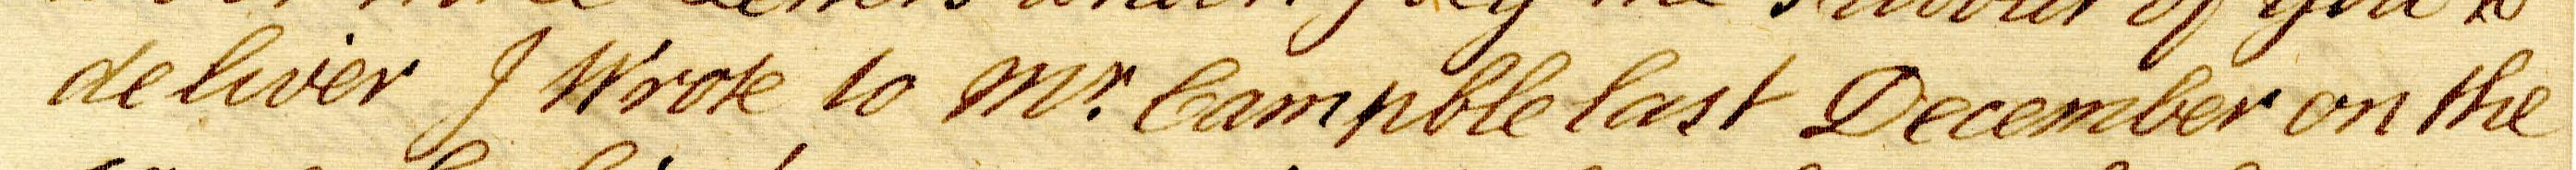deliver I wrote to M^r. Campble last December on the
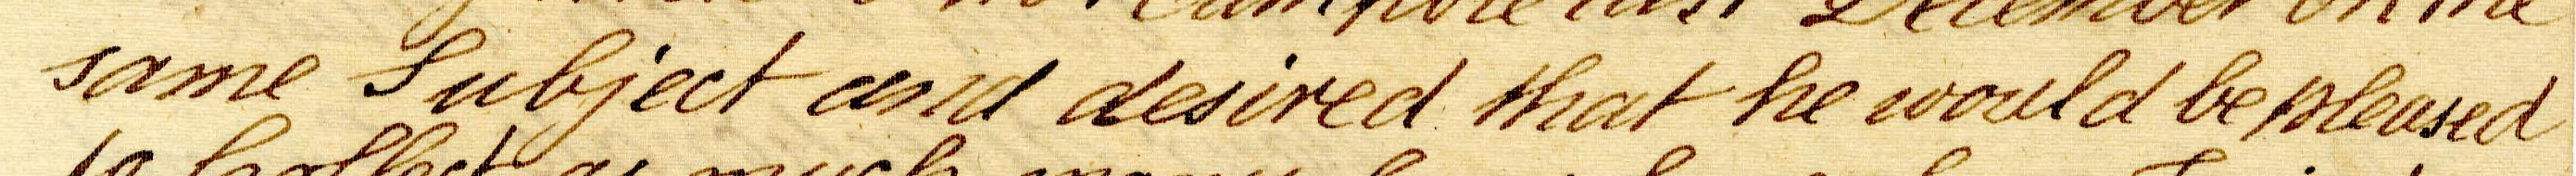same Subject and desired that he would be pleased
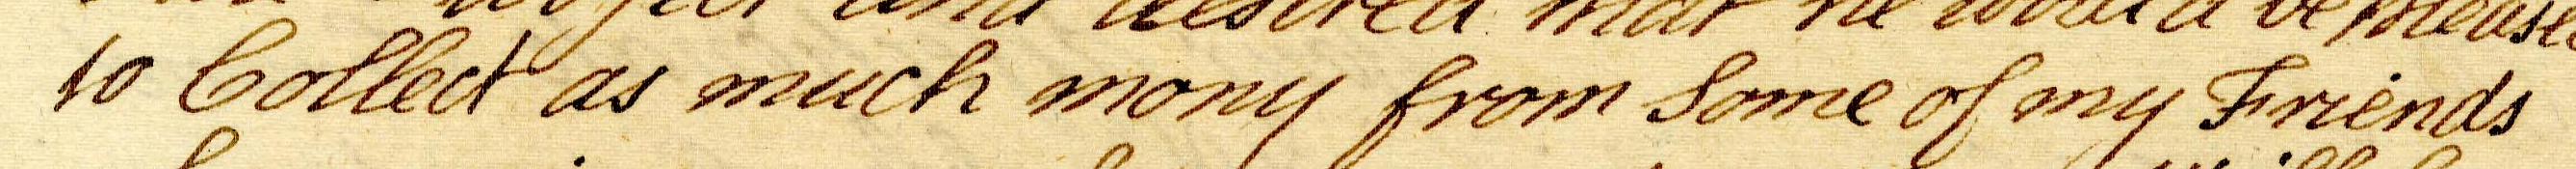to Collect as much mony from Some of my Friends
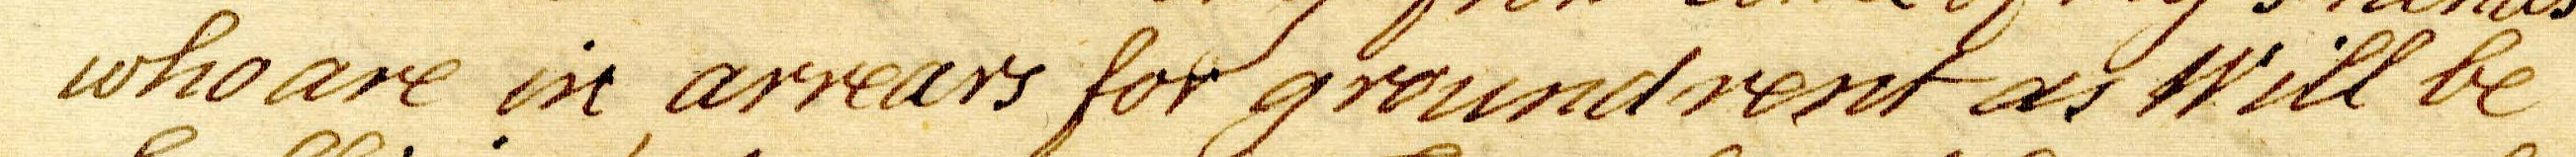who are in arrears for ground rent as Will be
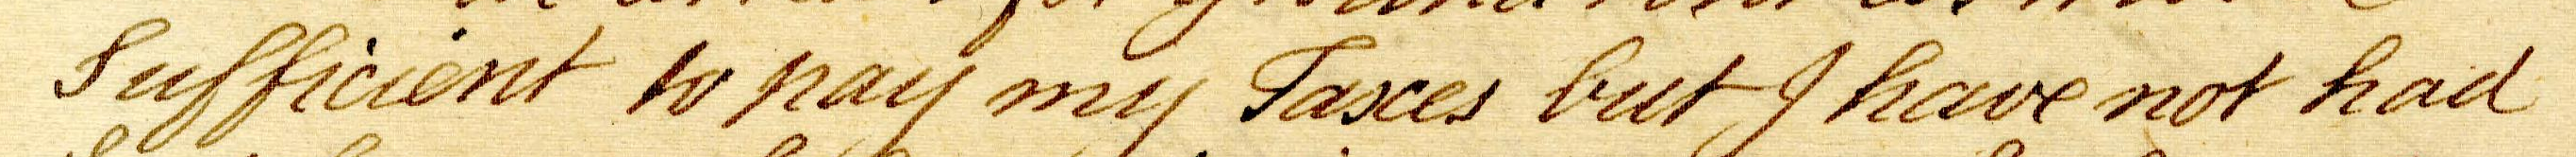Sufficient to pay my Taxes but I have not had
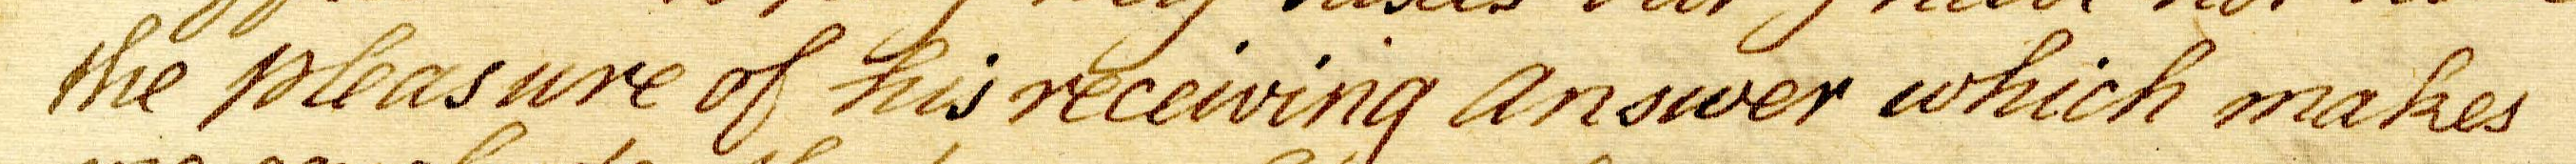the pleasure of his receiving Answer which makes
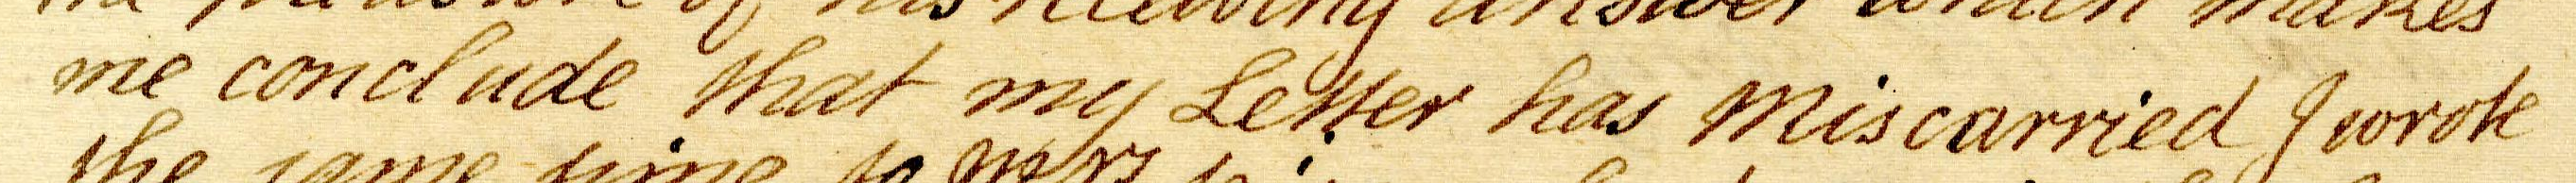me conclude that my Letter has Miscarried I wrote
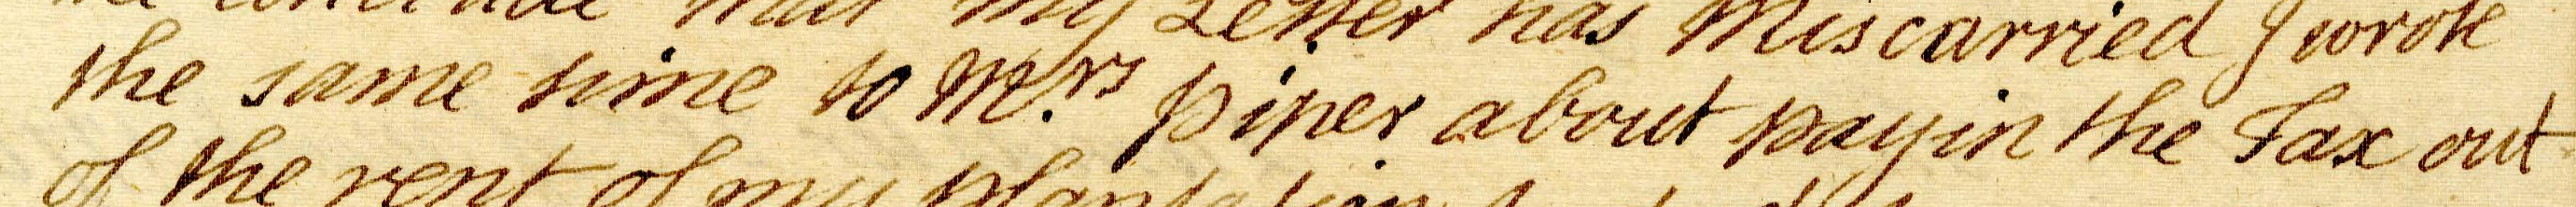the same time to M^rs. Piper about payin the Tax out
